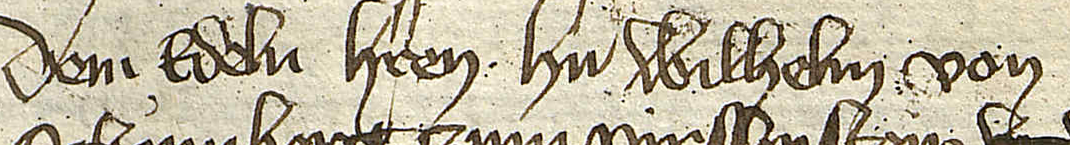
Dem Edeln hr*en hn* Wilhelm von
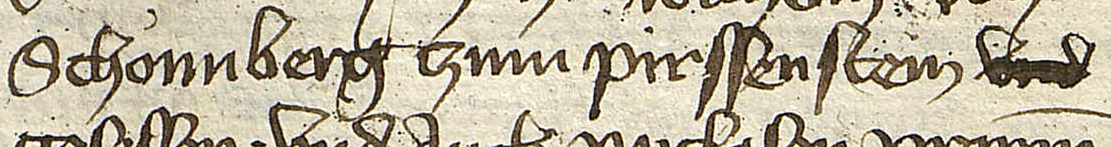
Schönnberg cʒum Pirſſenſtein vnd
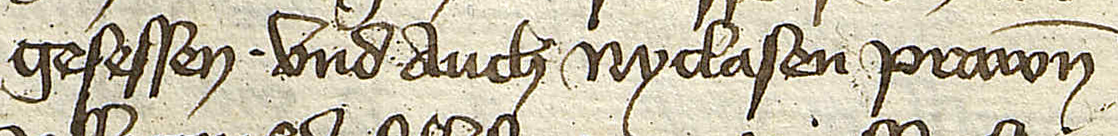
geſeſſen . vnd Auch Nyclaſen prawn*
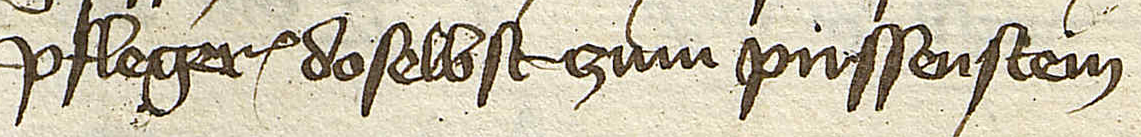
pfleger* doſelbſt cʒum pirſſenſtein
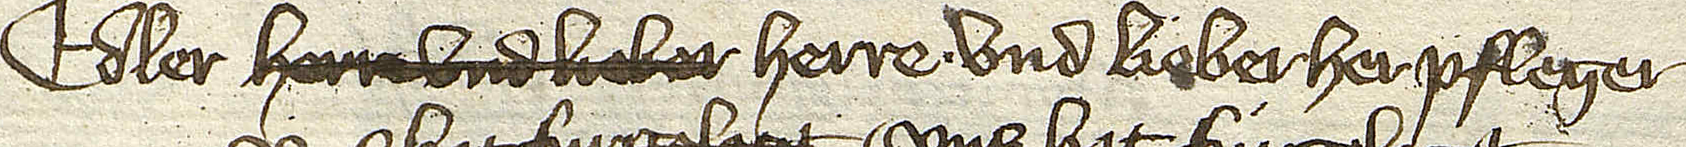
Edler herr vnd lieber herre . vnd lieber her pfleger
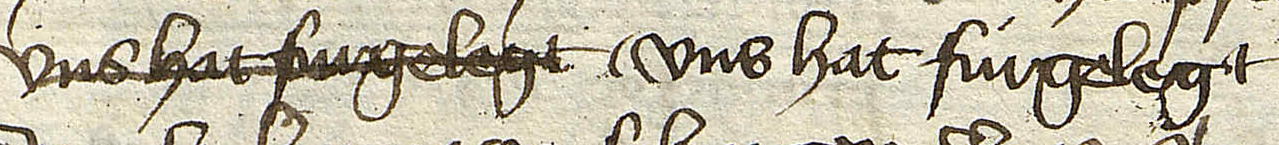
vns hat furgelegt / vns hat fürgelegt
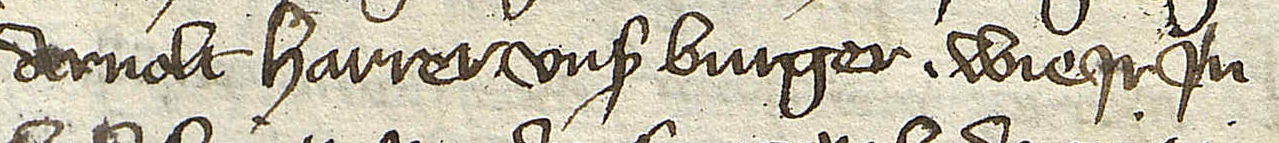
Arnolt Harrer vnſ* burger . wie Ir In
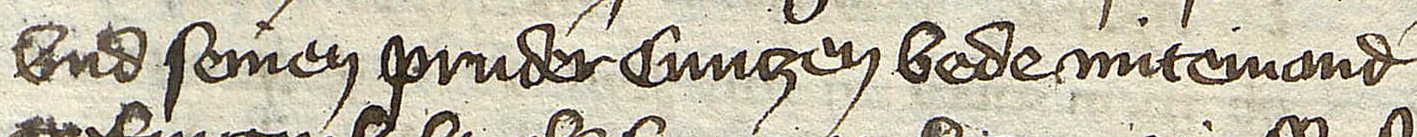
vnd ſeinen pruder Cuncʒen bede miteinand*
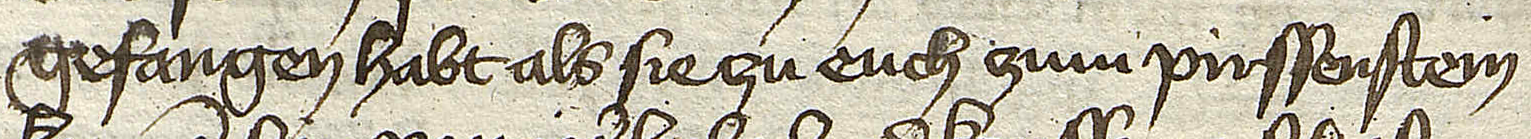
gefangen habt als ſie cʒu euch cʒum pirſſenſtein
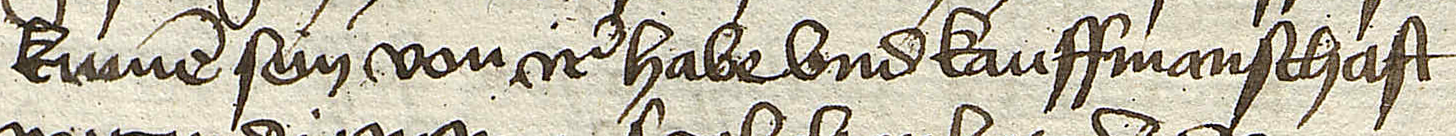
kume* ſein von ir* habe vnd kauffmanſchaft
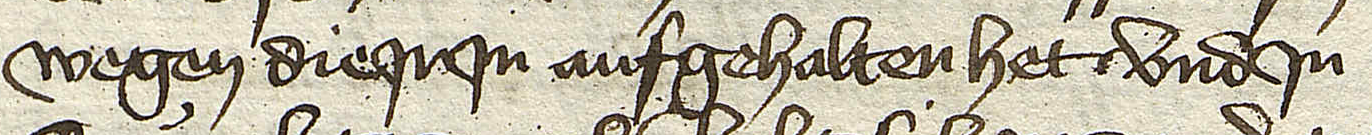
wegen die Ir In aufgehalten het / vnd In
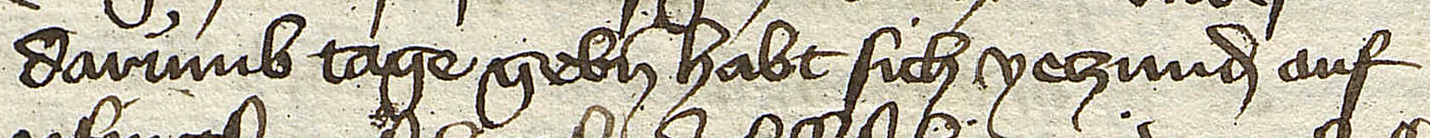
darümb tage gebn* habt ſich yecʒund* auf
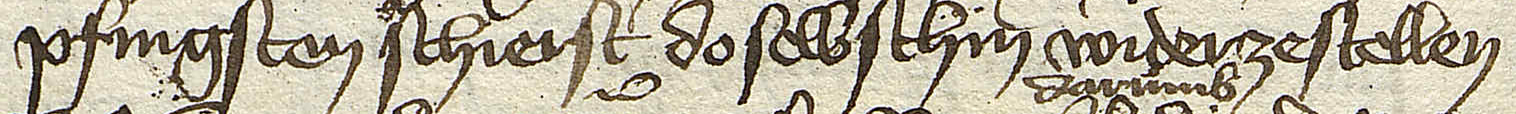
pfingſten ſchierſt doſelbſthin widercʒeſtellen
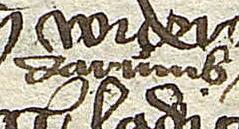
darümb
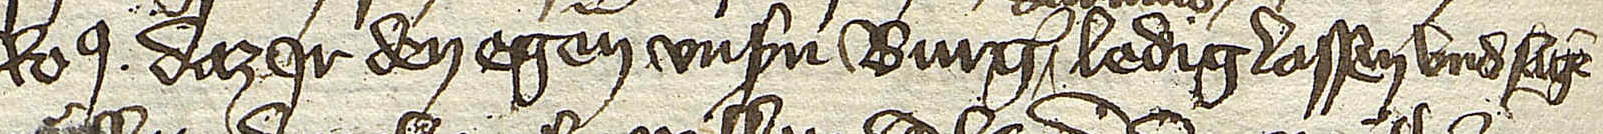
Ro*. daʒ Ir den egen* vnſn* Burg* ledig laſſen vnd ſage*
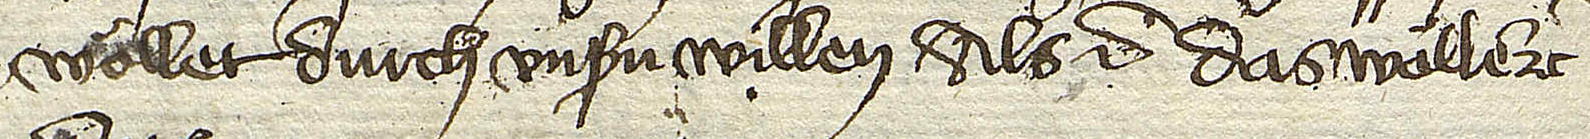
wöllet durch vnſ*n willen / Als ec* das wölle* ec*
